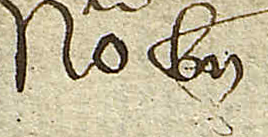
No* bn*
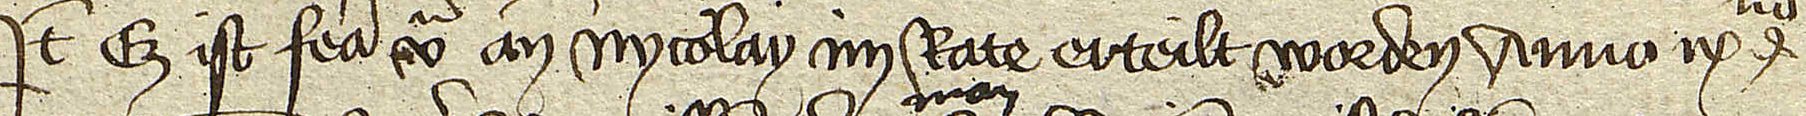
It* Eʒ iſt fea* v* an* Nycolay im Rate erteilt worden Anno ix* §
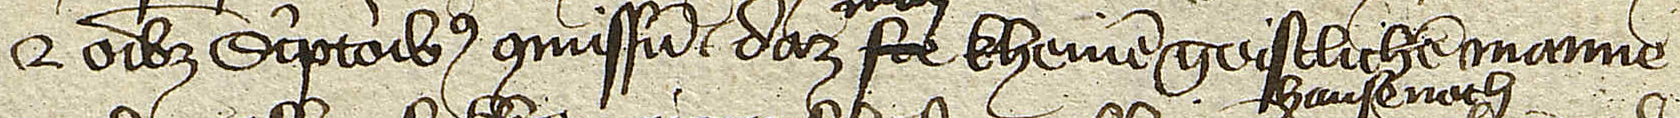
@ oib* Scptoib* *miſſu* / daʒ ſie kheine* geiſtliche* manne
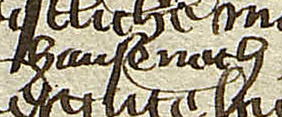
hauſe noch
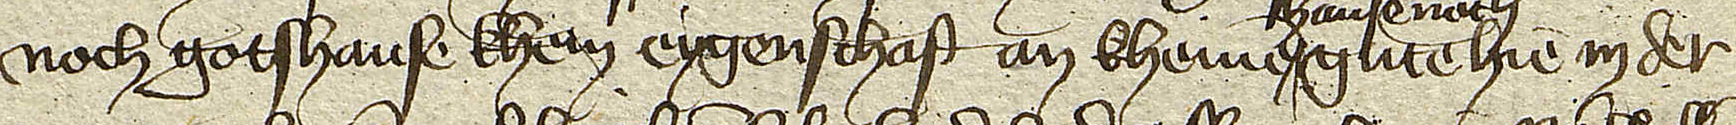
noch gotſhauſe khein eygenſchaft an kheine* gute hie in der
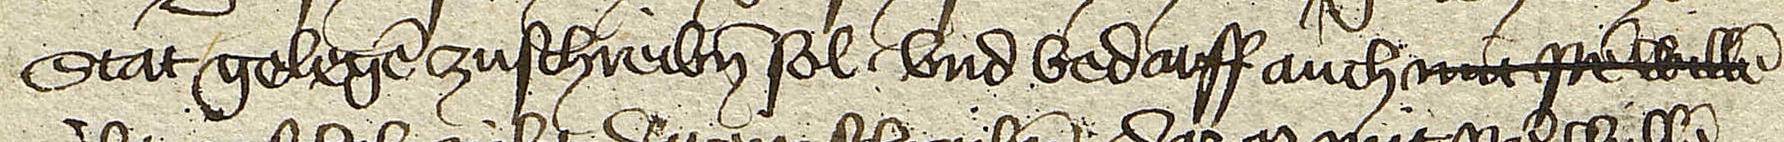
Stat gelege* cʒuſchreibn* ſol / vnd bedarff auch mit Ire* wille*
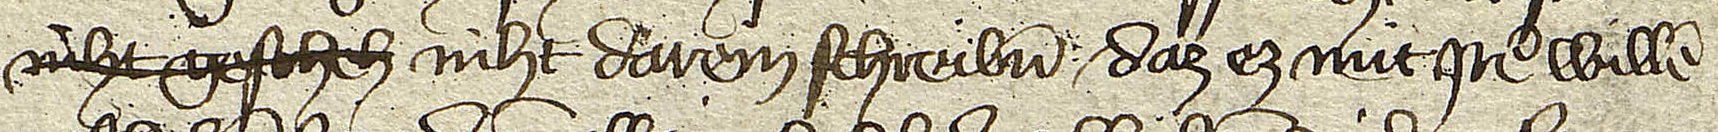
niht geſcheh niht darein ſchreibn* / daʒ eʒ mit Ire* wille*
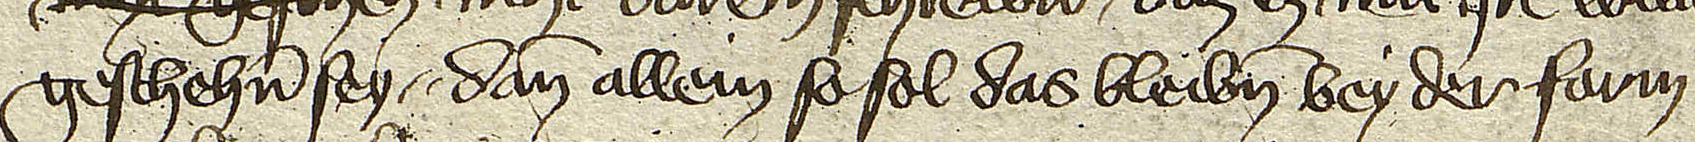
geſchehn* ſey / dan* allein ſo ſol das bleibn* bey der form
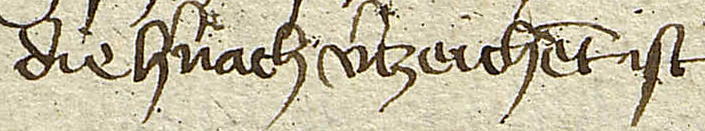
die h*nach v*cʒeichet* iſt
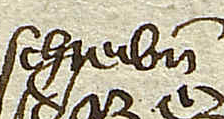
ſchreibn*
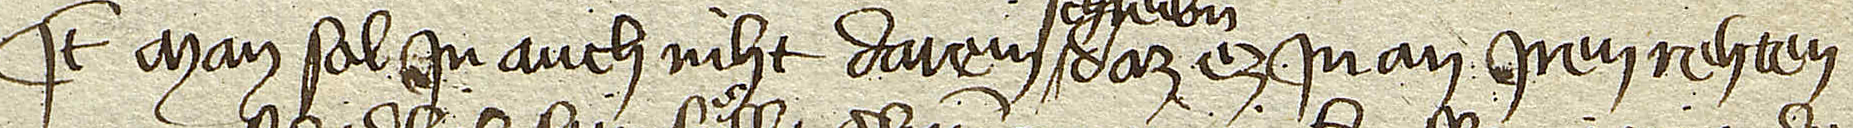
It* Man ſol In auch niht darein / daʒ eʒ In an Iren rehten
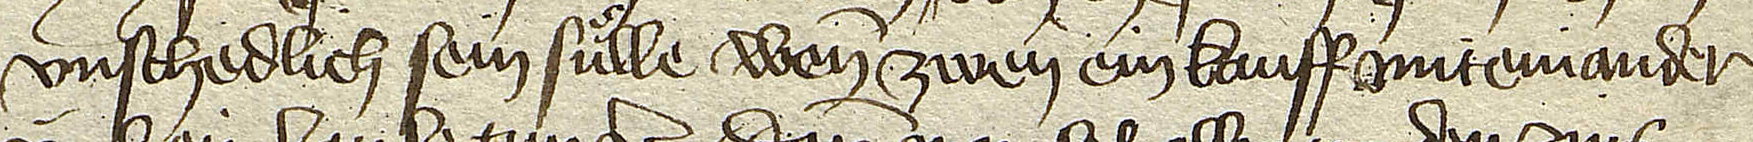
vnſchedlich ſein ſülle / wen* cʒwen ein kauff miteinander
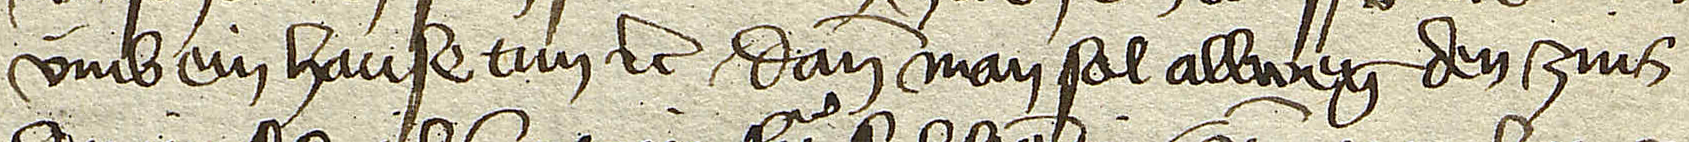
v̈mb ein hauſe tun ec* / dan* man ſol allweg den cʒins
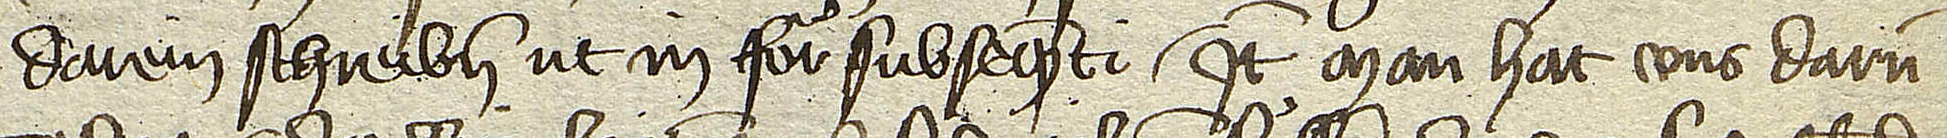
darein ſchreibn* ut in for* ſubſeqti* / It* Man hat vns daru*
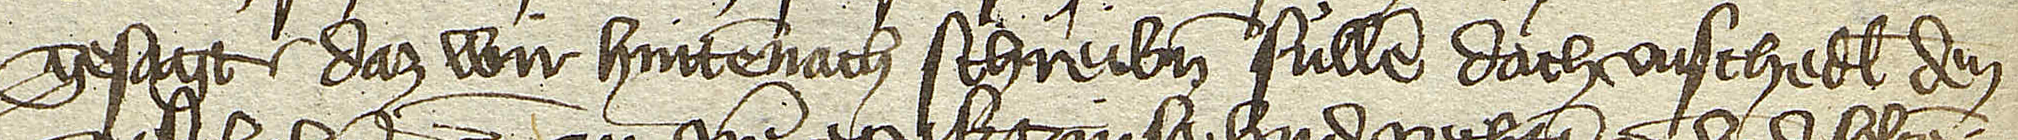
geſagt / daʒ wir hinte*nach ſchreibn* ſülle* doch vnſchedl* den
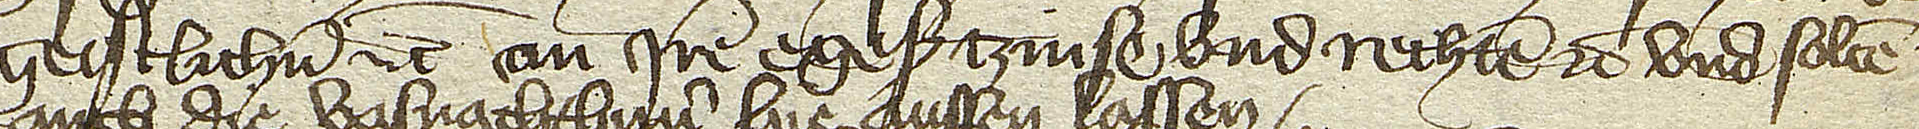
geiſtlichn* ec* an Ire* egeſ* cʒinſe rechte* ec* vnd ſolte*
